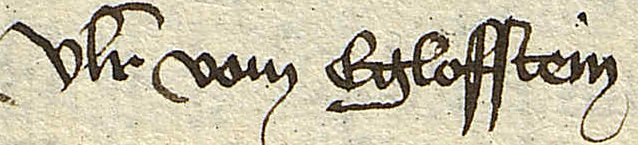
Vlr* vom Eglofſtein
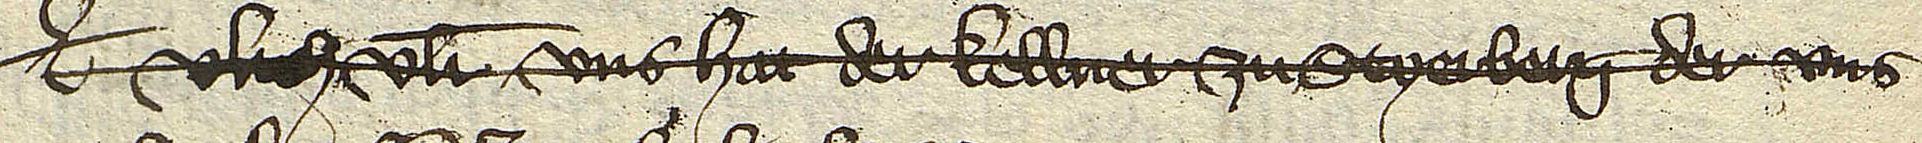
L* vlrch vlr* vns hat der kellner cʒu Styerberg der vns
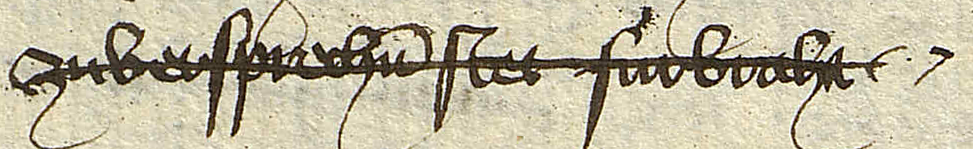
cʒuverſprechn* ſtet fürbraht / /
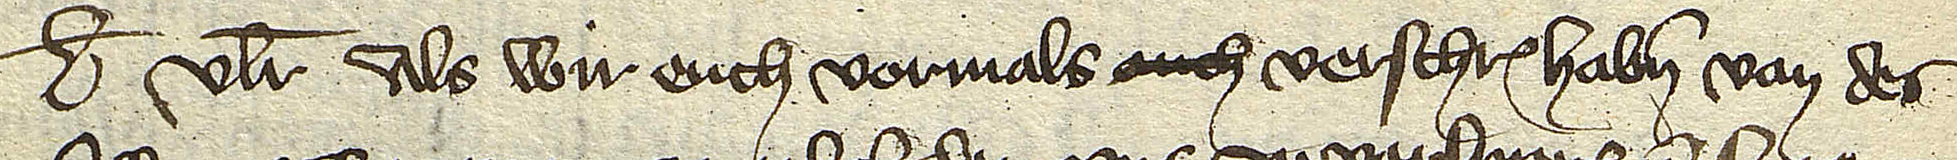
L* vlr* Als wir euch vormals auch verſchr* habn* von des
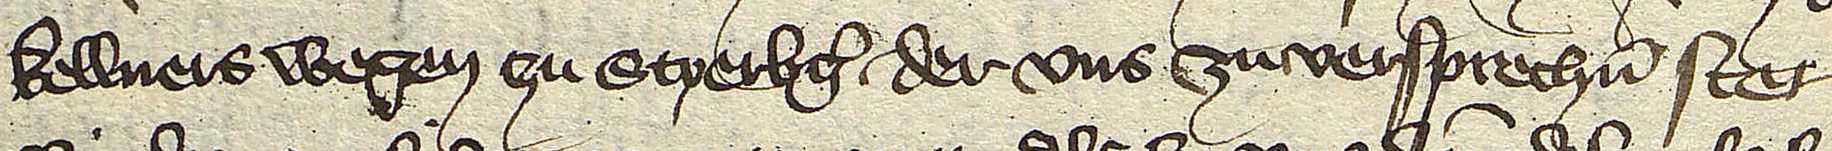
kellners wegen cʒu Styerbg* / der vns cʒu verſprechn* ſtet
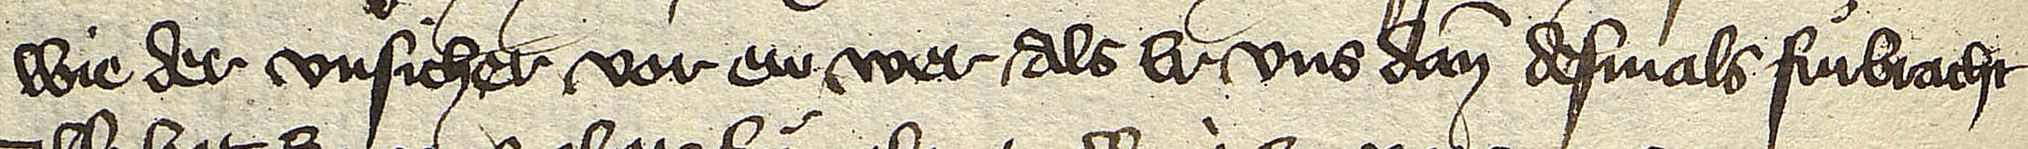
wie der vnſicher vor ew wer / als Er vns dan* deſmals fürbracht
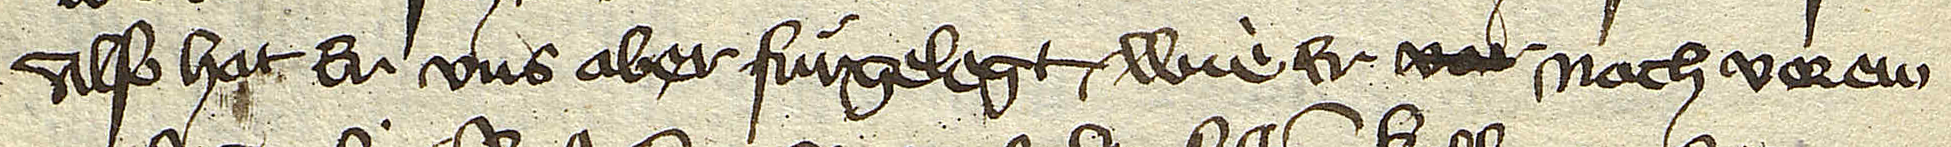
Alſo hat Er vns aber fürgelegt / wie Er vor noch vor ew
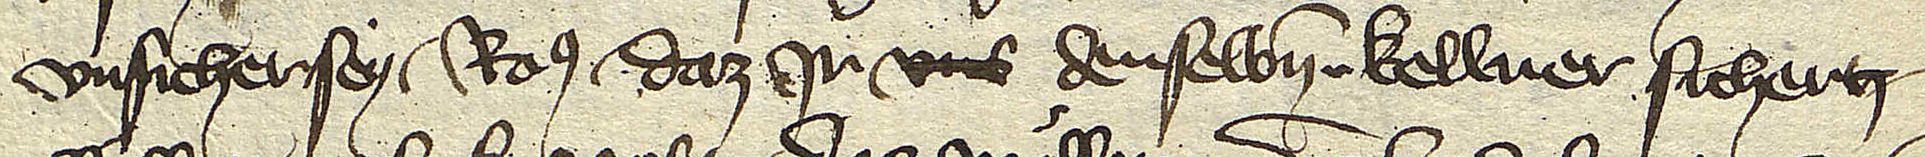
vnſicher ſey / Ro* / daʒ Ir vns denſelbn* ~ kellner ſichern*
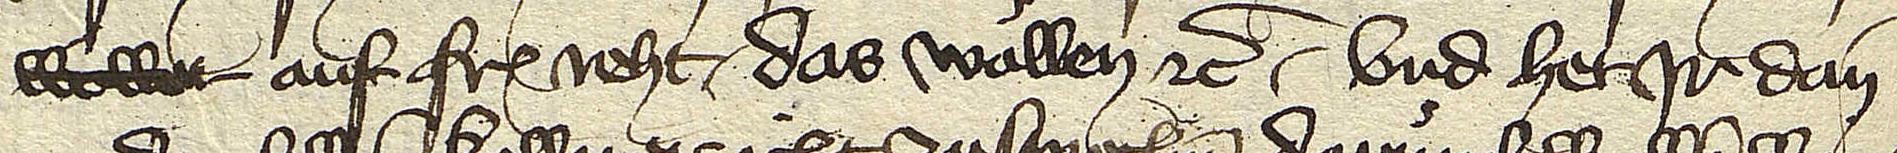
wollet auf fr* reht / das wöllen ec* / vnd het Ir dan*
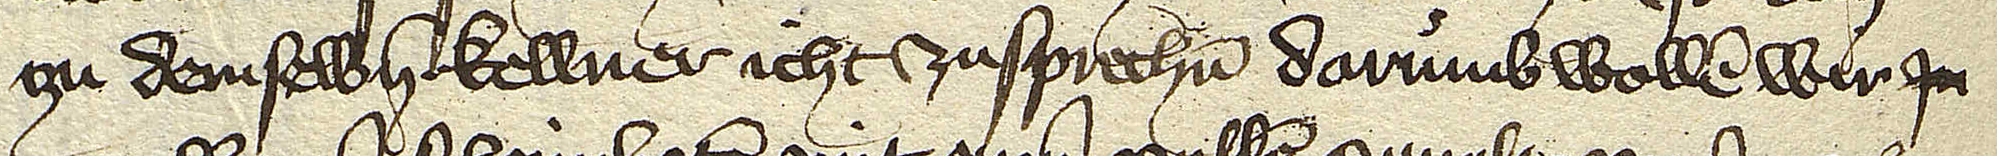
cʒu demſelbn* ~ kellner icht cʒuſprechn* darümb wolle* wir In
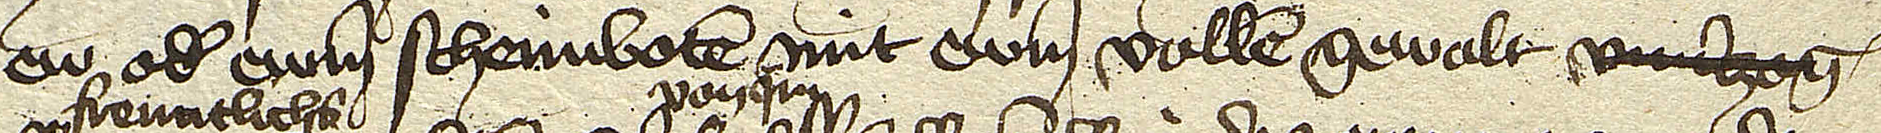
ew od* ewm* ſcheimbote* mit ewm* volle* gewalt vnu*cʒog*
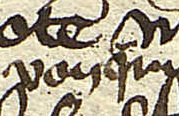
von Im
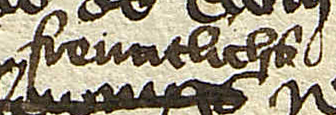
freuntlichs
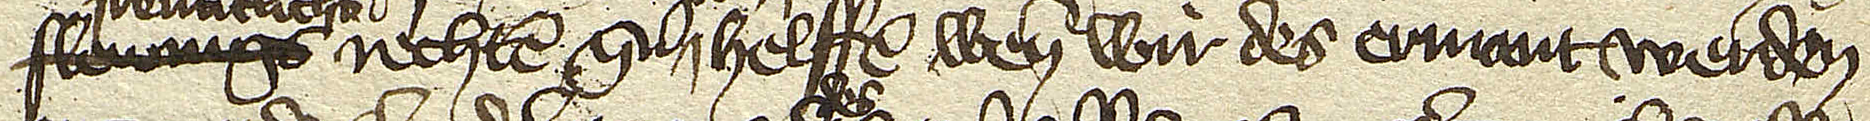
ſlewnigs rechte* gn* helffe* wen* wir des ermant werden
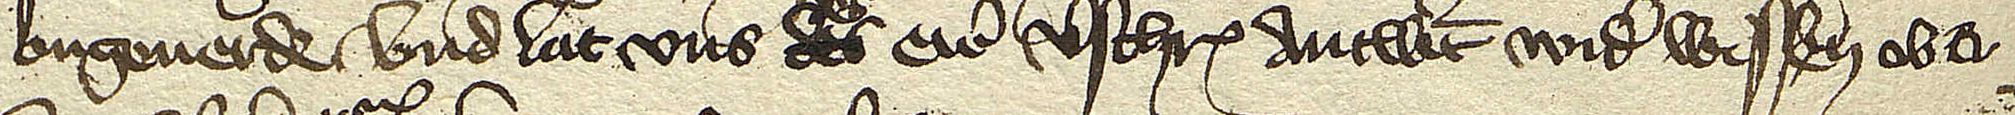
ongeuerde / vnd lat vns des ew* v*ſchr* Antwt* wid* wiſſen ob Er
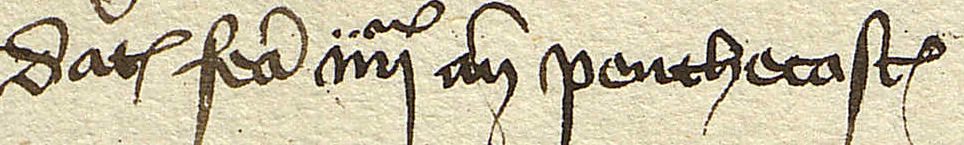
Dat* fea* iiii* an* Penthecoſt*
